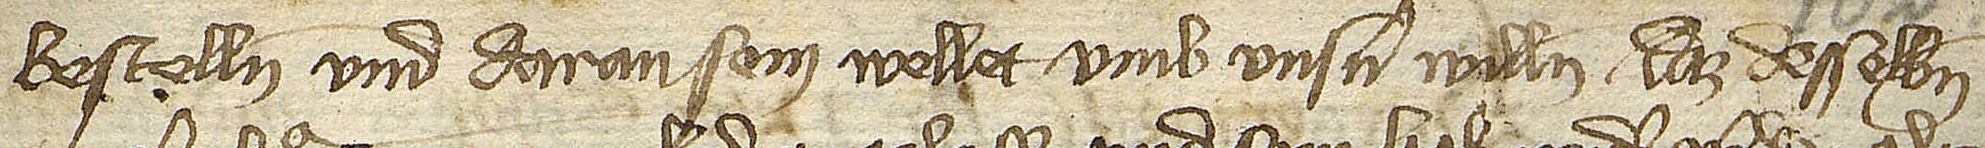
beſtelln* vnd daran ſein wellet vmb vnſn* willn* / daʒ deſſelbn*
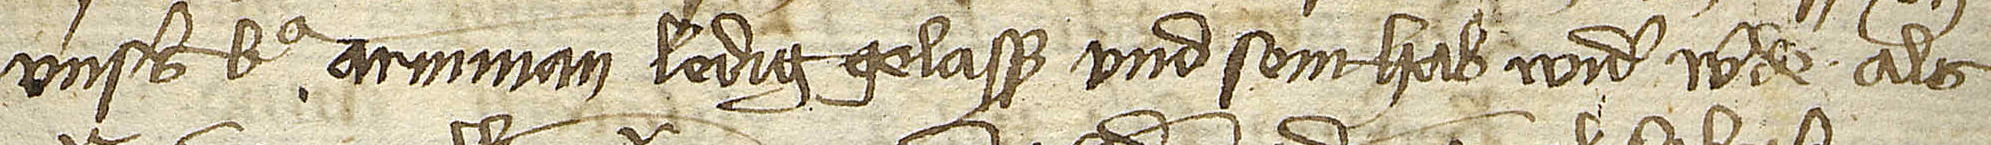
vnſ*s b* armman ledig gelaſſ* vnd ſein hab wid* w*de . als
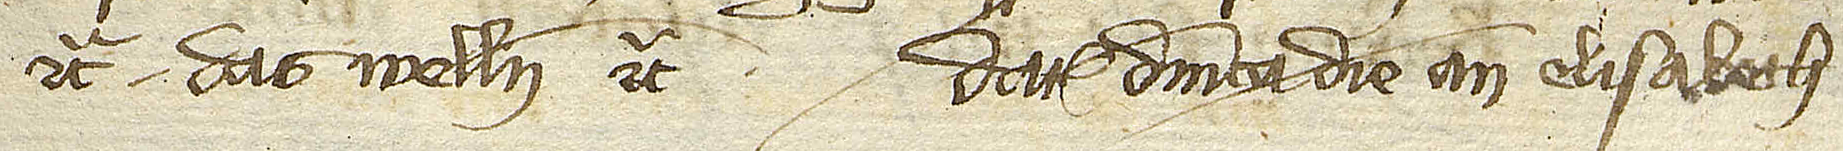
ec* / das welln* ec* . / Dat* dmca* die an* eliſabeth
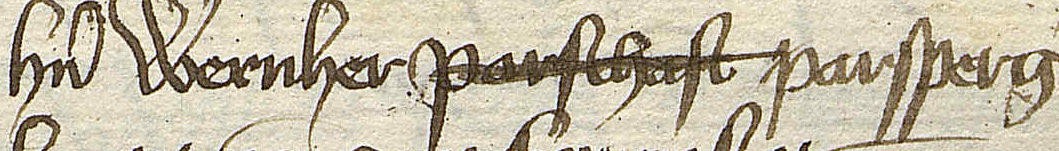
hn* Wernher Parſchaft Parſperg*
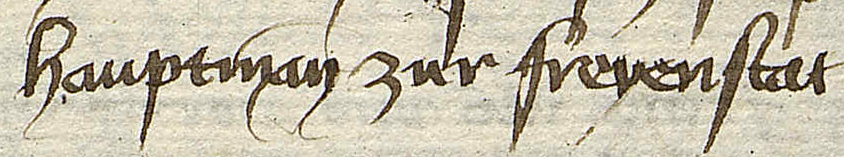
hauptman* ʒur Freyenſtat
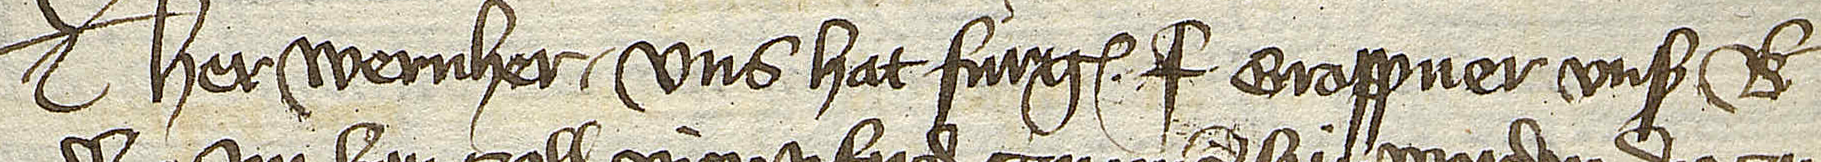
L* her wernher / vns hat fürg* . F. Groppner vnſ* B*
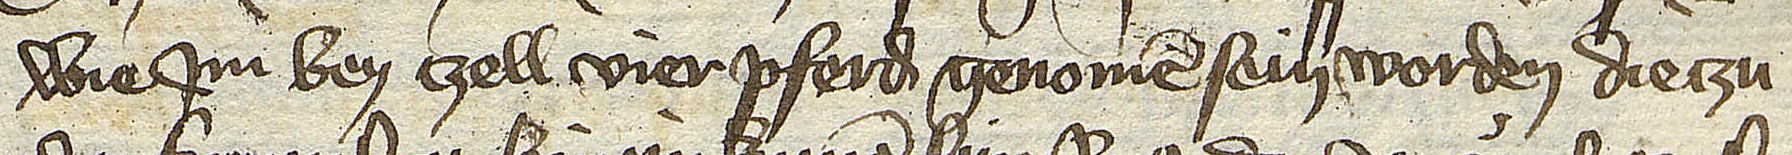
wie Im bey cʒell vier pferd genome* ſein worden die cʒu
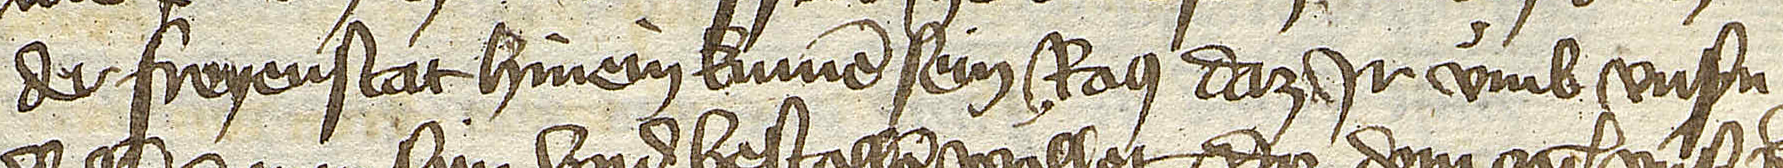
der freyenſtat hinein kume* ſein Ro* daʒ Ir v̈mb vnſ*n
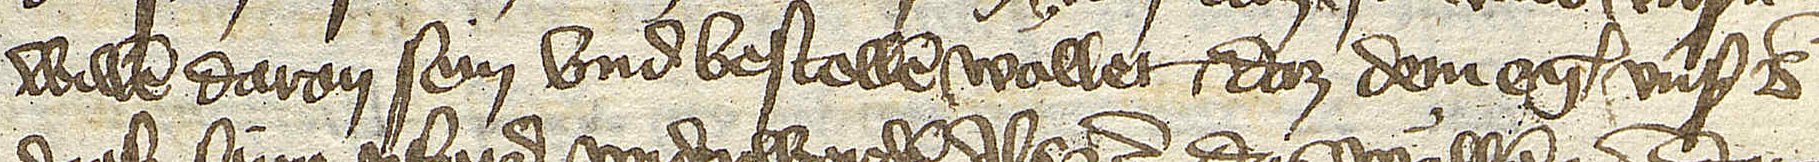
wille* daran ſein vnd beſtelle* wöllet / daʒ dem eg* vnſ* B*
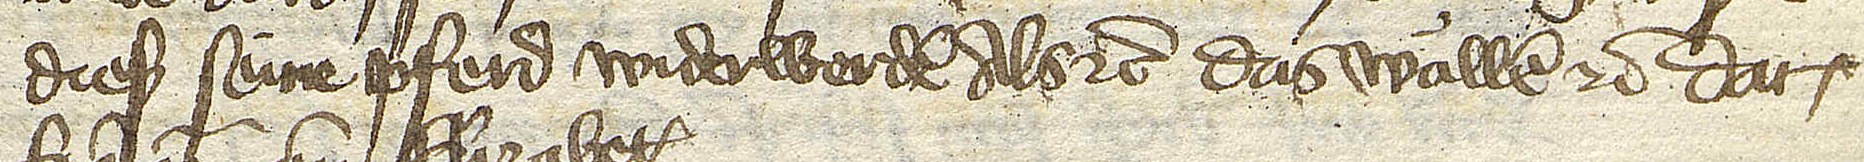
dieſ* ſeine pferd wider werd* Als ec* das wölle* ec Dat*
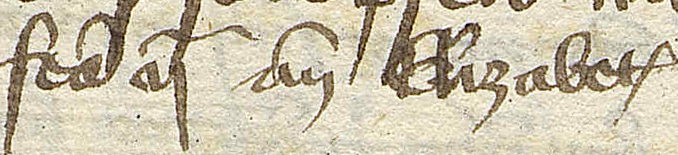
fea* ii* an* Eliʒabet*
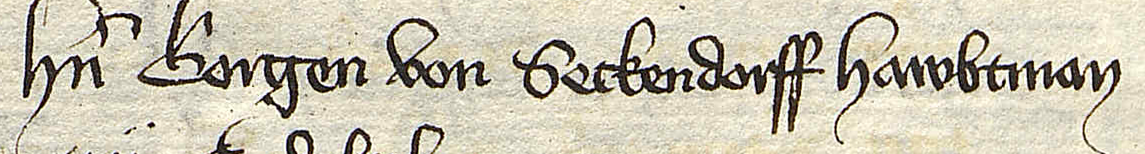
hn* Gorgen von Seckendorff hawbtman
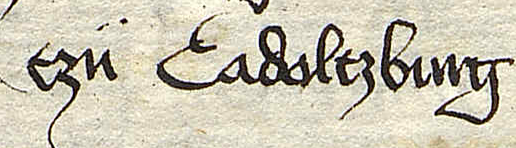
cʒü Cadolcʒburg
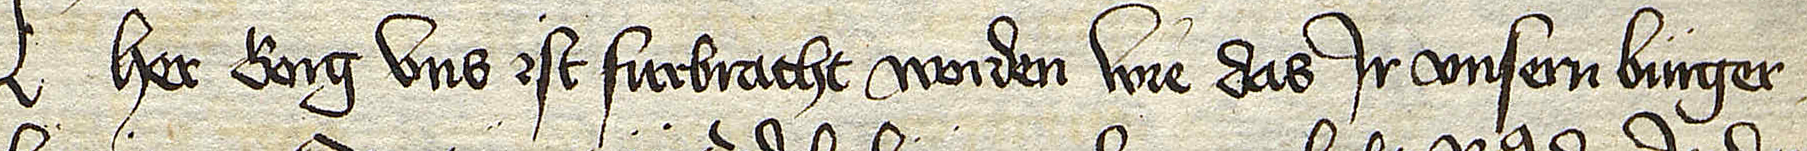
L* her Gorg vns iſt furbracht worden wie das Ir vnſern bürger
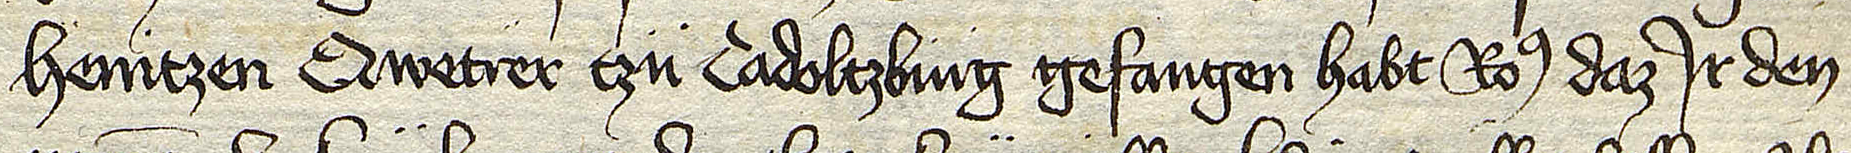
heincʒen Qwetrer cʒü Cadolcʒburg gefangen habt Ro* daʒ Ir den
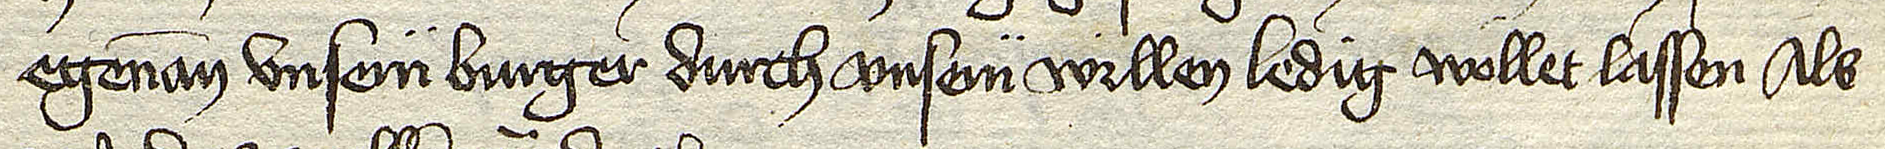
egenan* vnſern burger durch vnſern willen ledig wöllet laſſen Als
